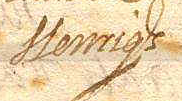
Henriq̄s
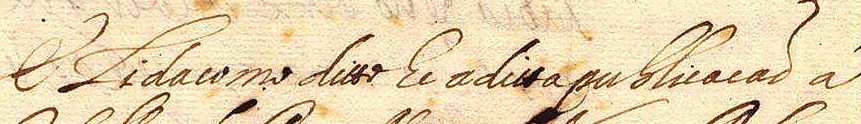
E Lida como ditto he a ditta publicaçaõ a
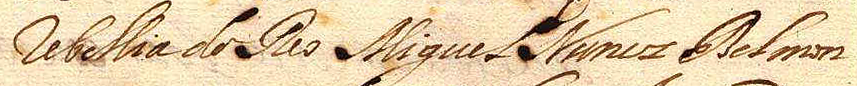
Rebellia do Reo Miguel Nunez Belmon
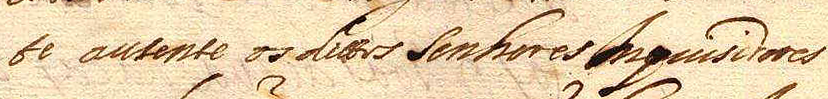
te auzente os dittos Senhores Inquisidores
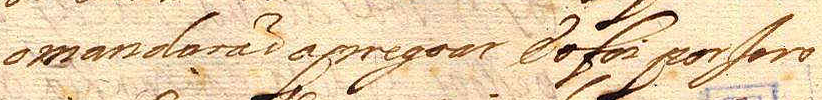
o mandaraõ apregoar e o foi por Jero
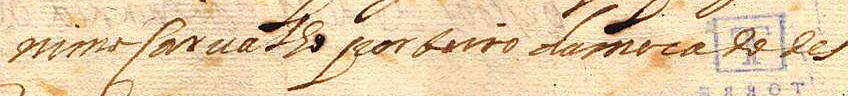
nimo Carualho porteiro da meza do des
